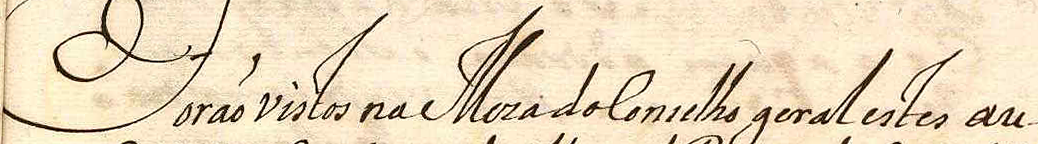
Foraõ vistos na Meza do Conselho geral estes au
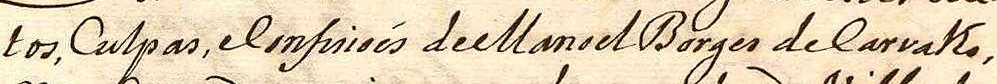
tos, Culpas, e Confissoẽs de Manoel Borges de Carvalho,
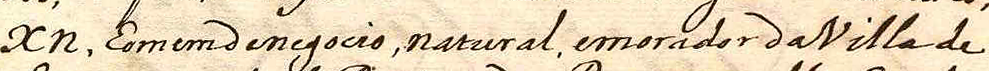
x n, homem de negocio, natural, e morador da Villa de
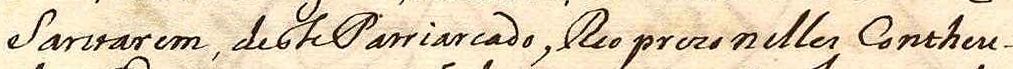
Santarem deste Patriarcado, Reo prezo nelles Contheu
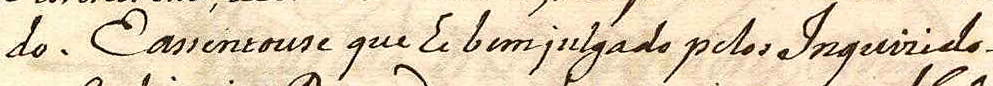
do. E assentouse que he bem julgado pelos Inquizido
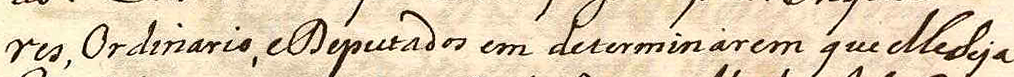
res, Ordinario, e Deputados em determinarem que elle Seja
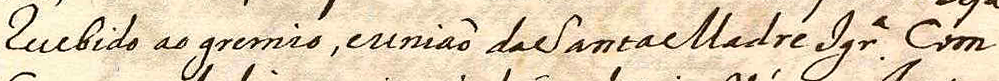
Recebido ao gremio, e uniaõ da Santa Madre Igr.a Com
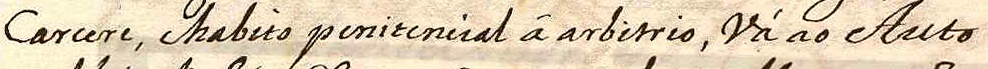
Carcere, e habito penitencial á arbitrio, Vá ao Auto
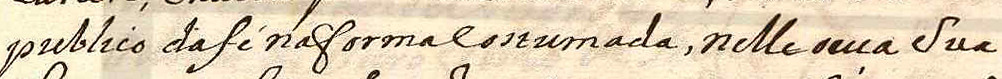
publico da fé na forma costumada, nelle ouça Sua
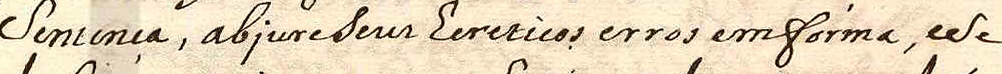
Sentença, abjure Seus hereticos erros em forma, e se
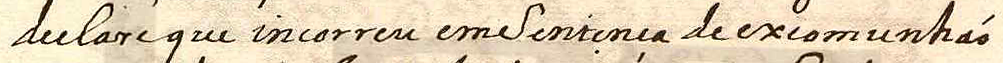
declare que incorreu em Sentença de excomunhaõ
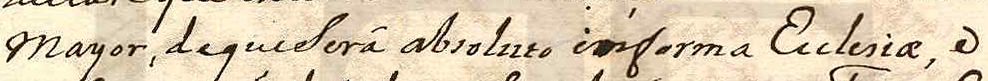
Mayor, de que Será absoluto in forma Ecclesiæ, e
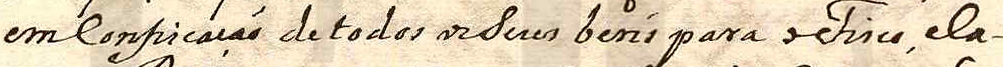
em Confiscaçaõ de todos os Seus bens para o Fisco, e Ca
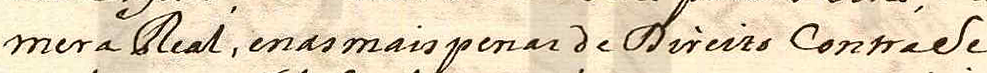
mera Real, e nas mais penas de Direito contra Se
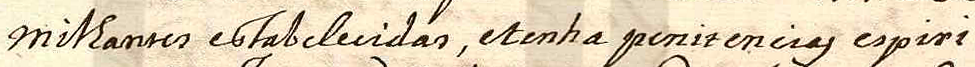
milhantes estabelecidas, e tenha penitencias espiri
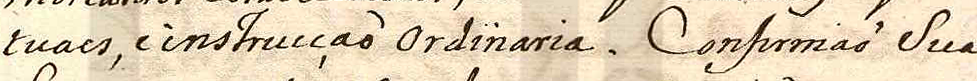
tuaes, e instrucção ordinaria. Confirmaõ Sua
